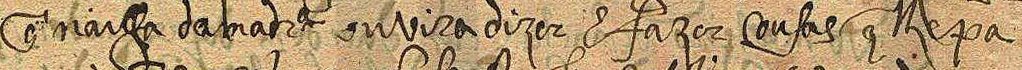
q̄ na ilha da madra ouvira dizer E fazer cousas q̄ lhe pa
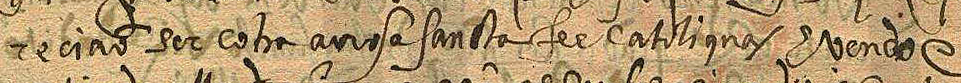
reciaõ ser cōtra a nosa sancta fee catoliqua / E vendo e
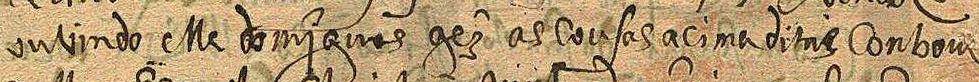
ouvindo elle domj̄guos gez̄ as cousas acima ditas Con bom
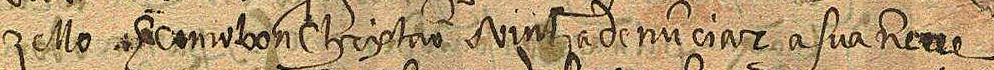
zello E como bon Christaõ o vinha denūciar a sua Reue
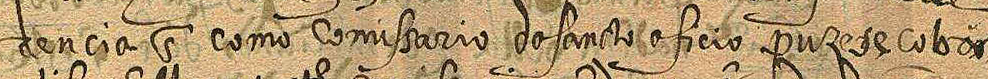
rencia q̄ como comissario do sancto oficio puzese cobro
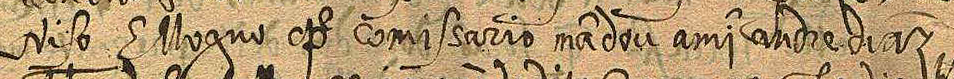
Niso E lloguo o pe comissario mādou a mj̄ andre diaz
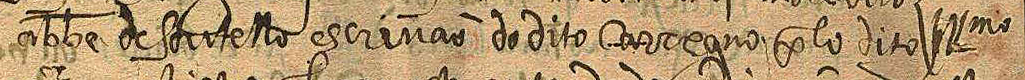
ab̄be de Soutello escriuaõ do dito Carreguo p̄lo dito Jllmo
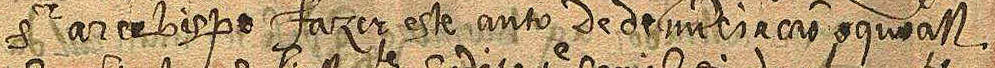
sor arcebispo fazer este auto de denūciação o quoall
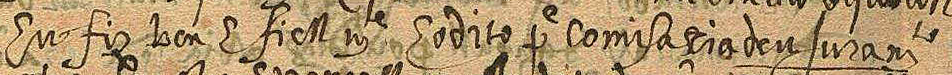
Eu fiz ben E fiellmte E o dito pe comisario deu Juramto
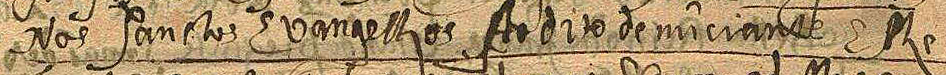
Nos Sanctos Evangelhos Ao dito denūciante E lhe
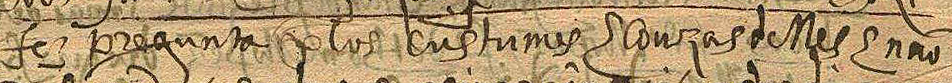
fez pregunta p̄los custumes E couzas delles E não
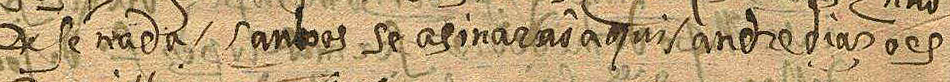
dise nada / E anbos se asinarão aqui / andre dias o es
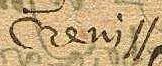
creui //
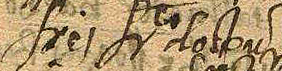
frej frco do spū
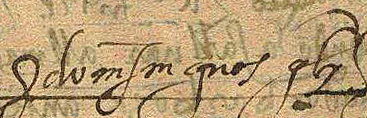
domJmguos glz̄
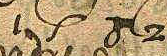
1582
